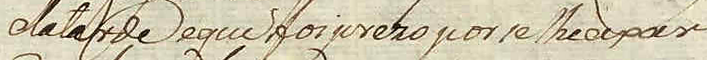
da tarde e que foi prezo por se lhe axar
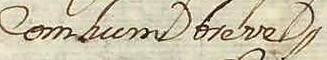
Com hum breve//
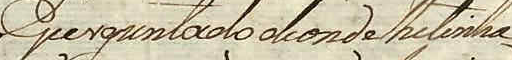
E perguntado de onde lhe tinha
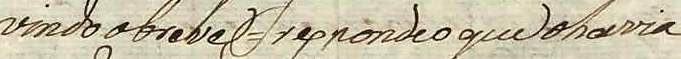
vindo o breve = respondeo que o havia
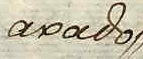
axado//
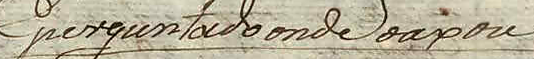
E perguntado onde o axou
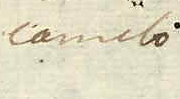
camilo
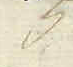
5
